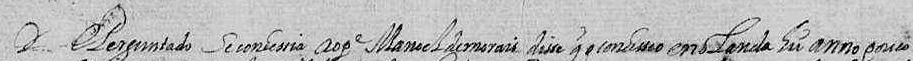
item E Perguntado Se conhessia ao pe Manoel de morais disse q̄ o conhesseo en olanda hū anno pouco
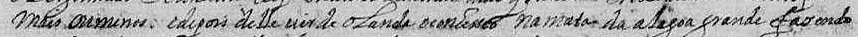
mais ou menos. e depois delle uir de olanda o conhesseo na mata da alegoa grande fazendo
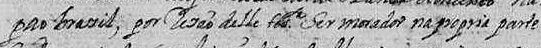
pao brazil, por Rezaõ delle tes.ta Ser morador na propria parte
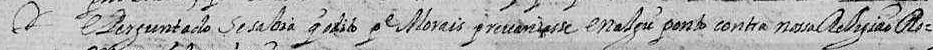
item E Perguntado Se sabia q̄ o dito pe Morais preuaricasse en algū ponto contra nossa Relligiaõ Ro
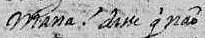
mana? disse q̄ não
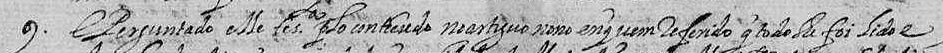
9. E Perguntado elle tes.ta plo contheudo no artiguo nono en q̄ uem Referido q̄ todo lhe foi lido e
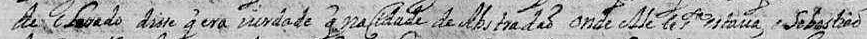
declarado disse q̄ era uerdade q̄ na Cidade de Abstradaõ onde elle testa estaua, e Sebastiaõ
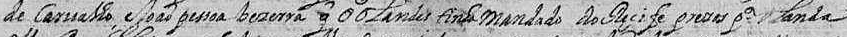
de Carualho, e Joaõ pessoa bezerra q̄ o olandes tinha mandado do Recife prezos p.a olanda
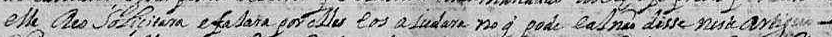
elle Reo solicitara e falara por elles e os aiudara no q̄ pode e al naõ disse neste artiguo
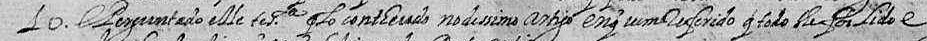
10. E Perguntado elle tes.ta p̄lo contheudo no dessimo artigo en q̄ uem Referido q̄ todo lhe foi lido e
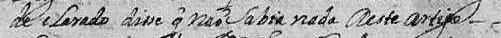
declarado disse q̄ não sabia nada neste artigo.
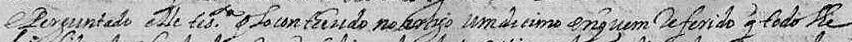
E Perguntado elle tes.ta plo contheudo no artigo umdecimo en q̄ uem Referido q̄ todo lhe
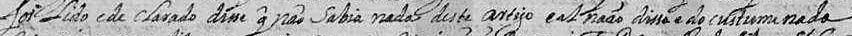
foi Lido e declarado disse q̄ não sabia nada deste artigo e al naão disse e do custume nada
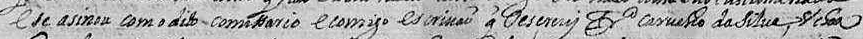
E se asinou com o dito comissario e comigo escriuaõ q̄ O escreuj Frco carualho da Silua, Vchoa
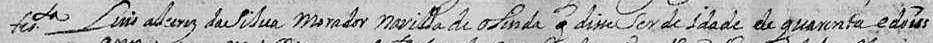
tes.ta Luis aluerez da Silua morador na villa de olinda q̄ disse ser de Idade de quarenta e dous
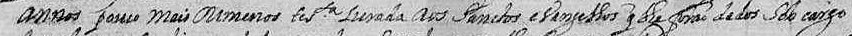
annos pouco mais ou menos tes.ta Iurada aos Sanctos eVangelhos q̄ lhe foraõ dados sob cargo
